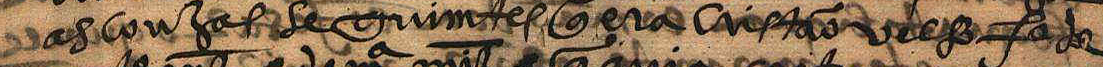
as couzas seguimtes q̄ era cristaõ velho fo de
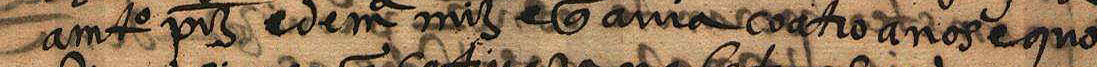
amto pīz e de ma mīz e q̄ auia coatro anos e quo
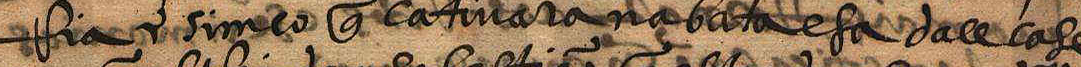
Ria ē simco q̄ catiuara na batalha dallcase
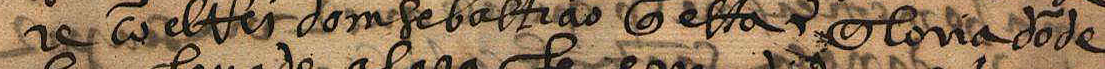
re c̄o el Rei dom sebastião q̄ esta ē gloria dōde
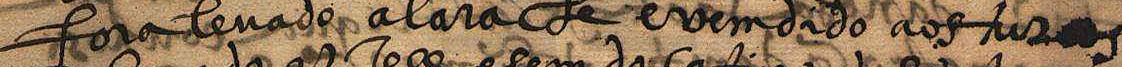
fora leuado a larache e vemdido aos turcos
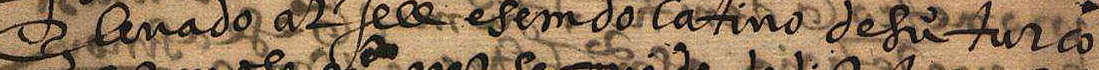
e leuado arJell e semdo Catiuo de hū turco
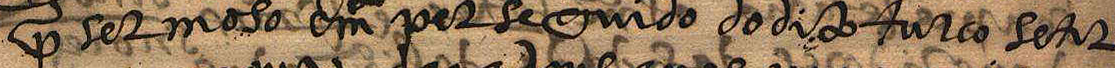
p̄o ser moso e mto perseguido do dito turco se tor
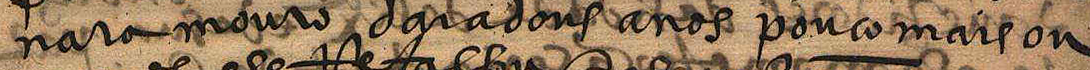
nara mouro dara dous anos pouco mais ou
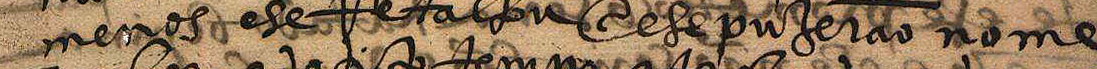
menos e se Retalhou e lhe puzerão nome
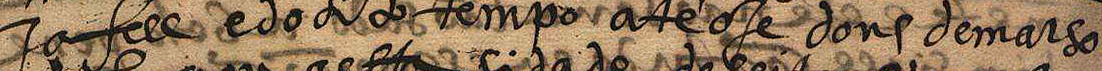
Jafell e do dito tempo ate oJe dous de marso
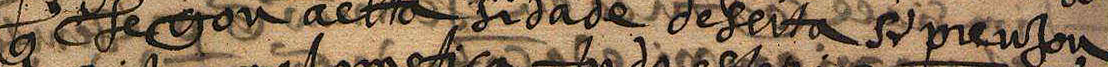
q̄ chegou a esta sidade de seita sēpre uzou
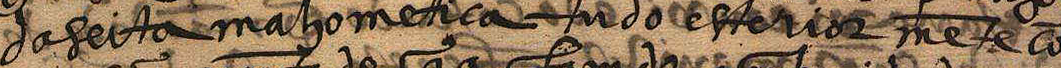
da seita mahometica tudo esteriormēte c̄o
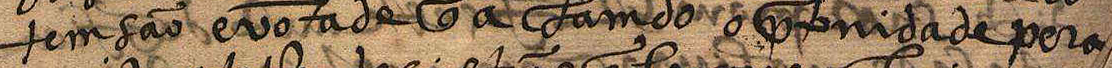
temsão e vōtade q̄ achamdo op̄tonidade pera
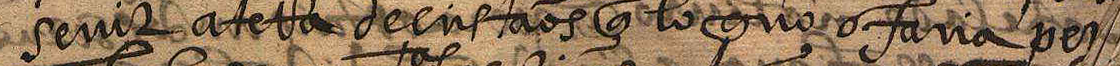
se uir a teRa de cristaõs q̄ loguo o faria per
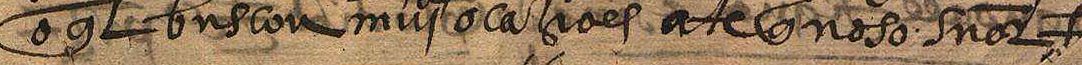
o q̄L buscou mujtas ocazioẽs ate q̄ noso snōr
